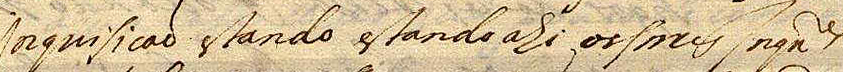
Jnquisiçāo estando estando ahi os snres Jnqures
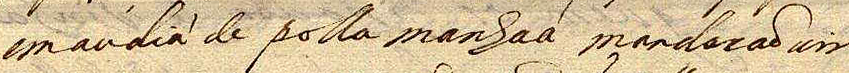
em audiā de polla manhaā mandaraõ uir
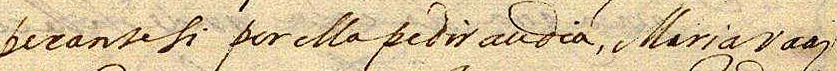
perante si per ella pedir audiā, Maria vaaz̄
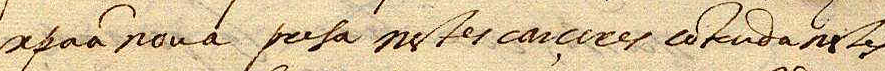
xpaā noua presa nestes carçeres cōteuda nestes
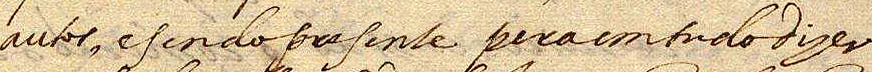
autos, e sendo presente pera em tudo dizer
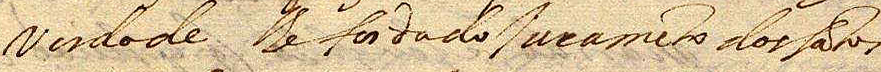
verdade lhe foi dado Juramēto dos Sātos
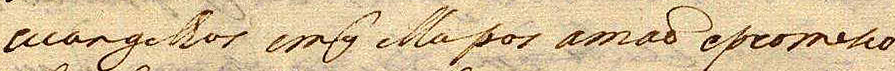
euangelhos em q̄ ella pos a maõ e prometeo
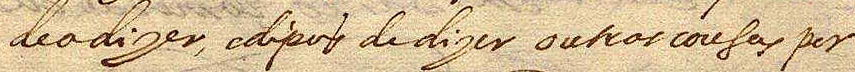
de a dizer, e dipois de dizer outras cousas per
